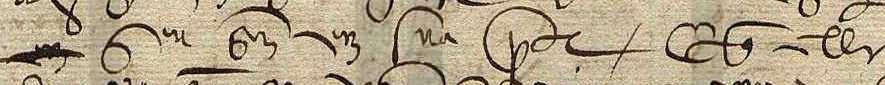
em seu s̄or em sua p̄te / E q̄ elle
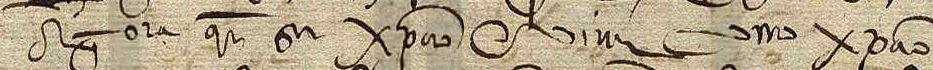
Agora q̄r ser xpão e viuer Como xpão
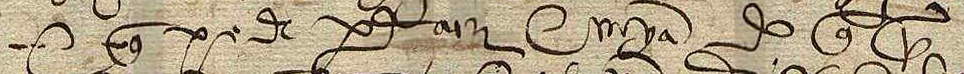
e q̄ pede ꝑdam e mȳa do q̄ p̄o
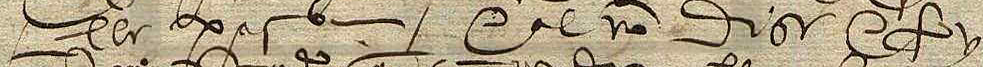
elle pasou / e al nō dise e foy
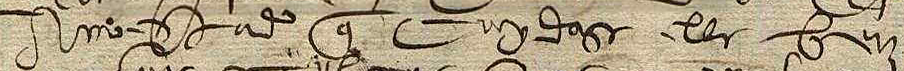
Amoestado q̄ cuydase elle bem
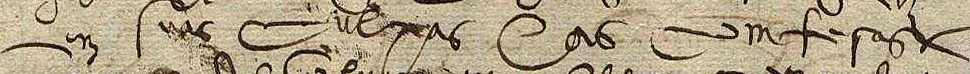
em suas Culpas e as Comfesase
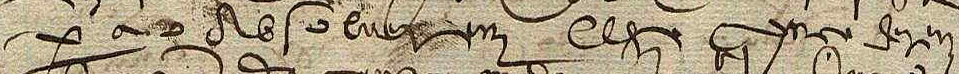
ꝑa o Absoluerem e lhe concederem
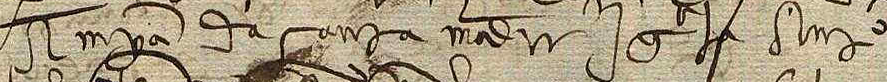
A mȳa da santa madre JḡJa Anto
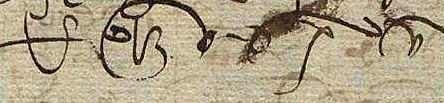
Roj̄z o esp̄vy
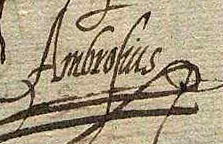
Ambrosius
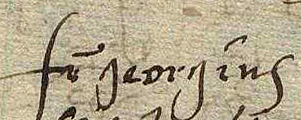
fr̄ georgius
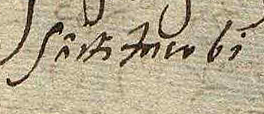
sācti Iacobi
